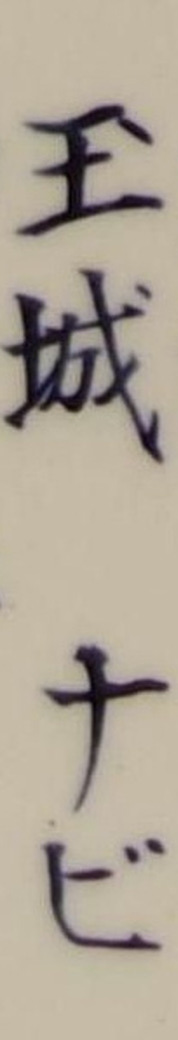玉城ナビ
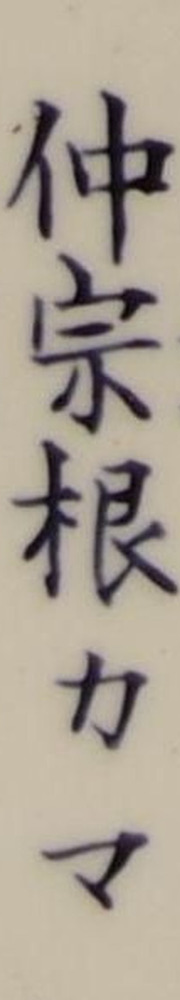仲宗根カマ
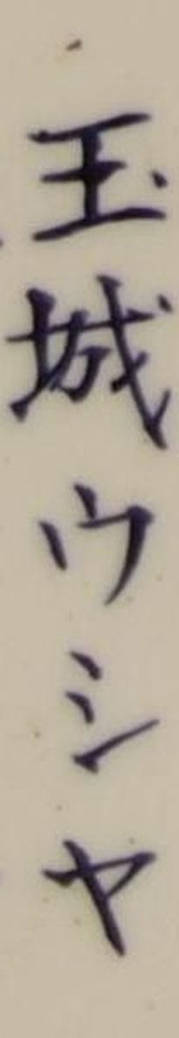玉城ウシヤ
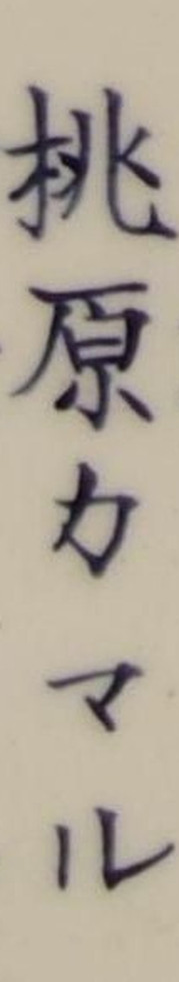桃原カマル
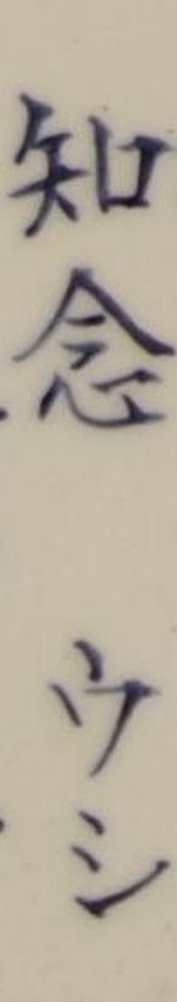知念ウシ
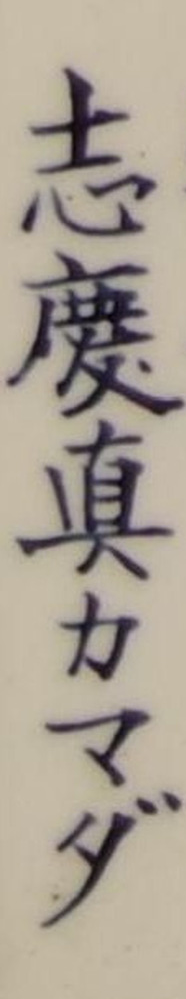志慶真カマダ

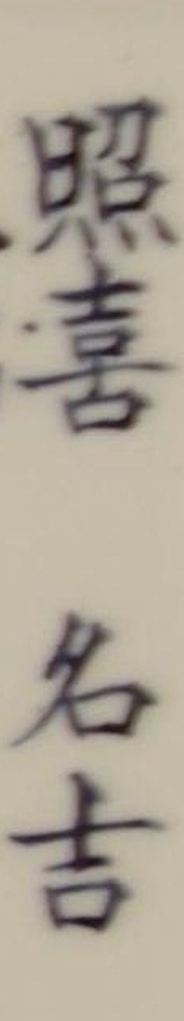照喜名吉
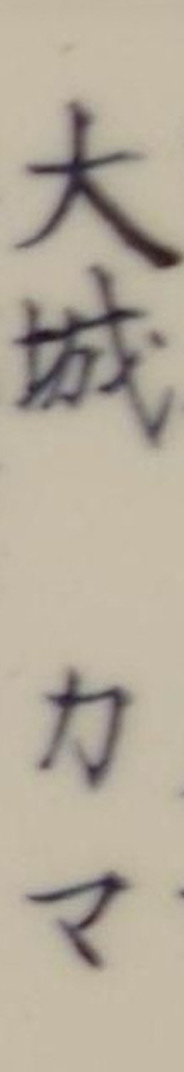大城カマ
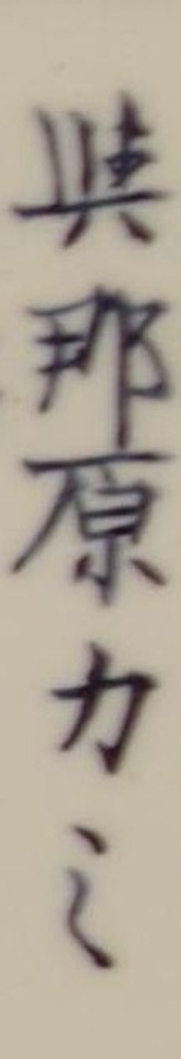与那原力ミ
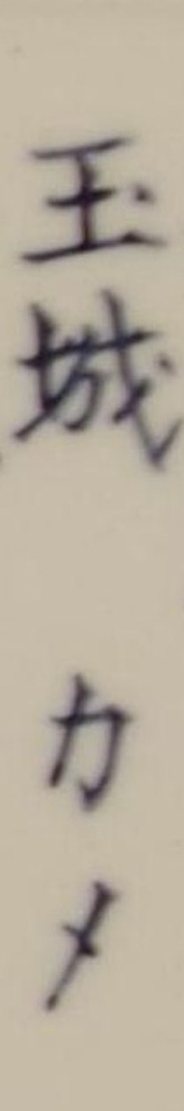玉城カメ
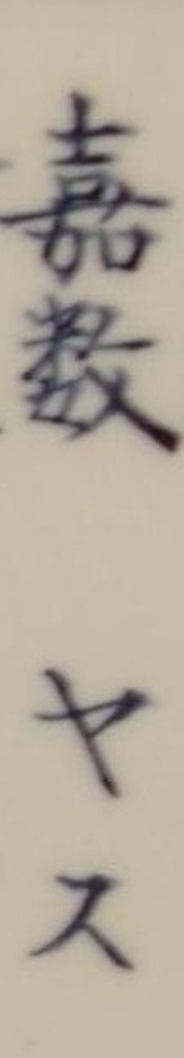嘉数ヤス
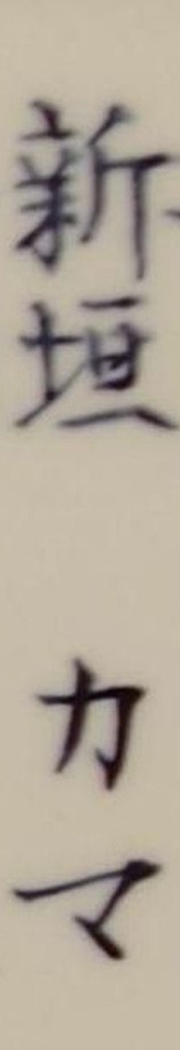新垣カマ
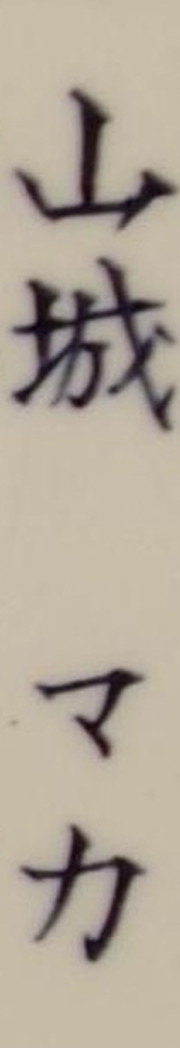山城マカ
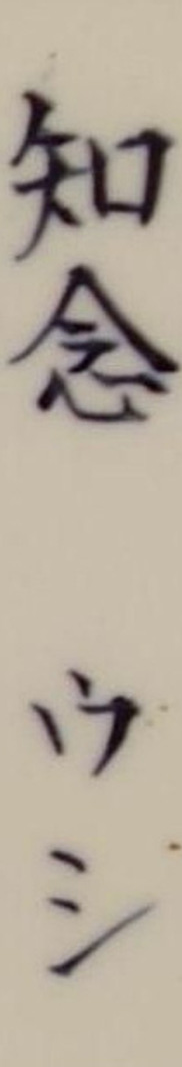知念ウシ
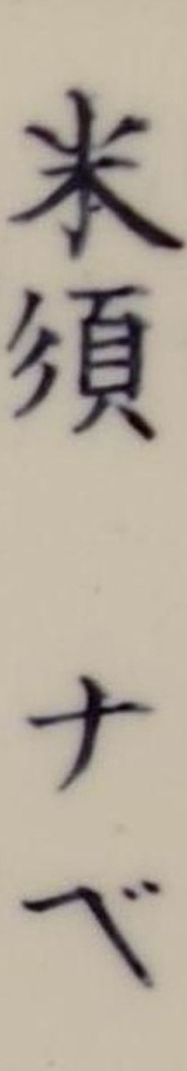米須ナベ
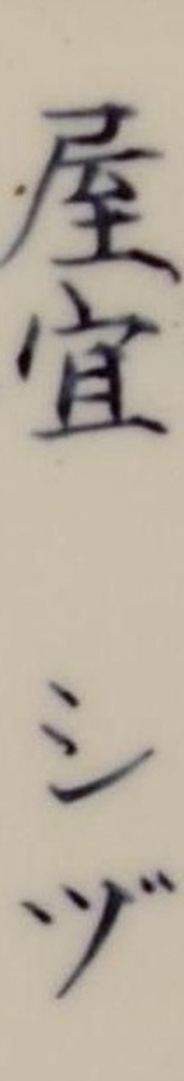屋宜シヅ
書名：E~L
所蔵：高野山金剛峯寺
